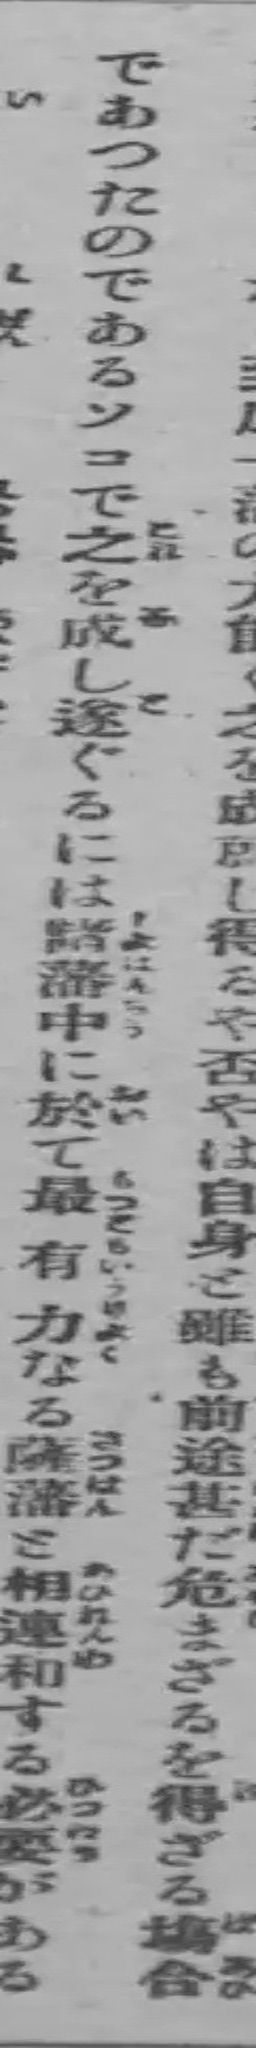であつたのであるソコで之を成し遂ぐるには緒藩中に於て最有力なる薩藩と相連和する必要がある
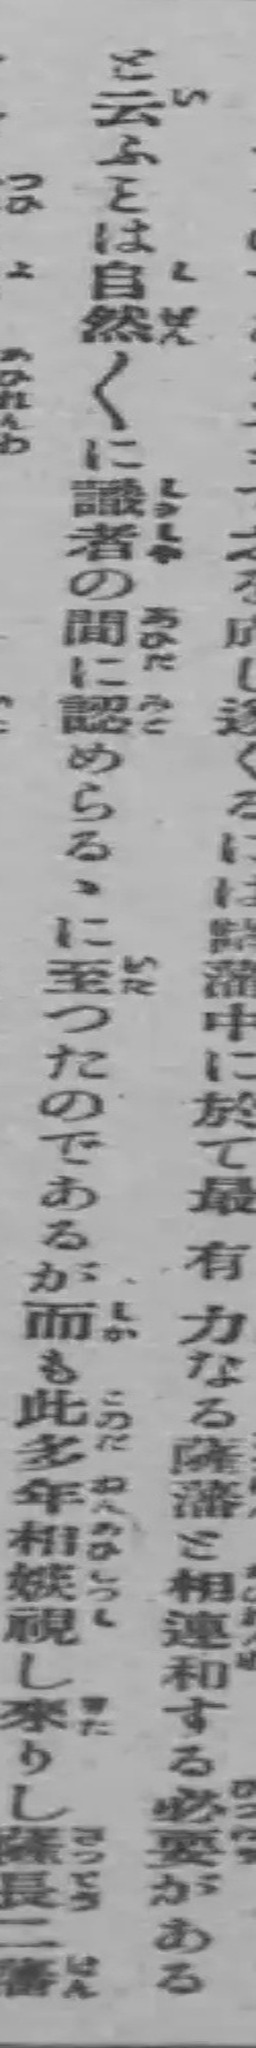と云ふことは自然〳〵に識者の間に認めらるゝに至つたのであるが而も此多年相嫉視し来りし薩長二藩
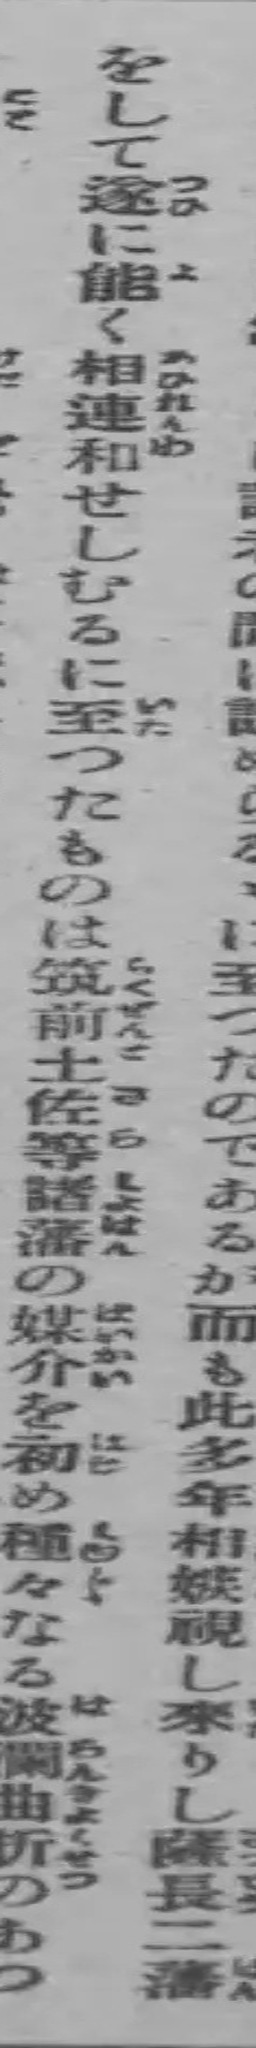をして遂に能く相連和せしむるに至つたものは筑前土佐等緒藩の媒介を初め種々なる波瀾曲折のあつ
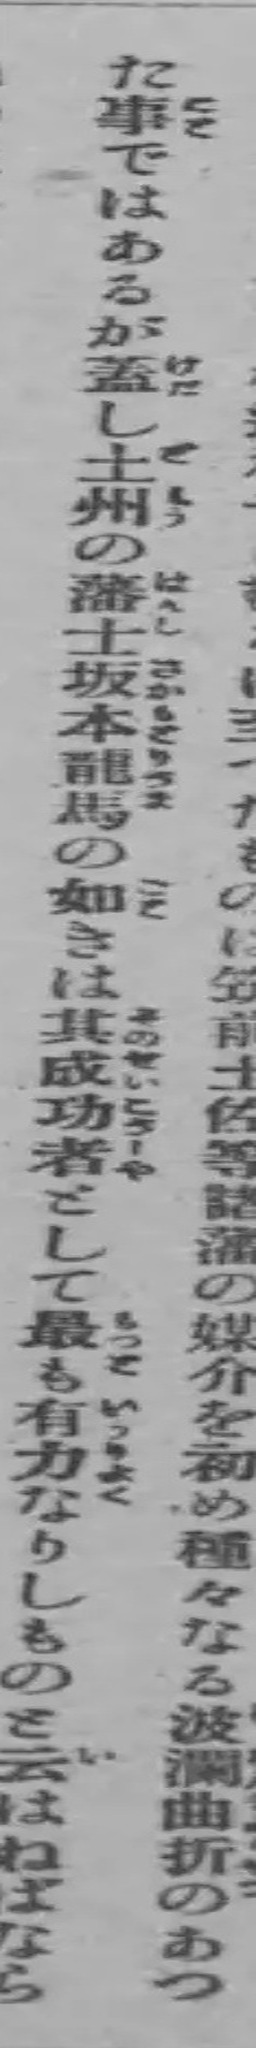た事ではあるが蓋し土州の藩士坂本龍馬の如きは其成功者として最も有力なりしものと云はねばなら
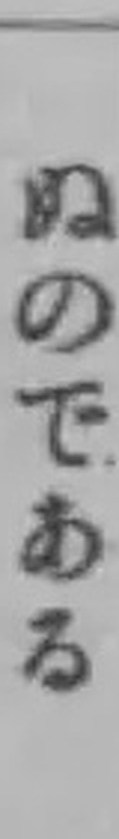ぬのである
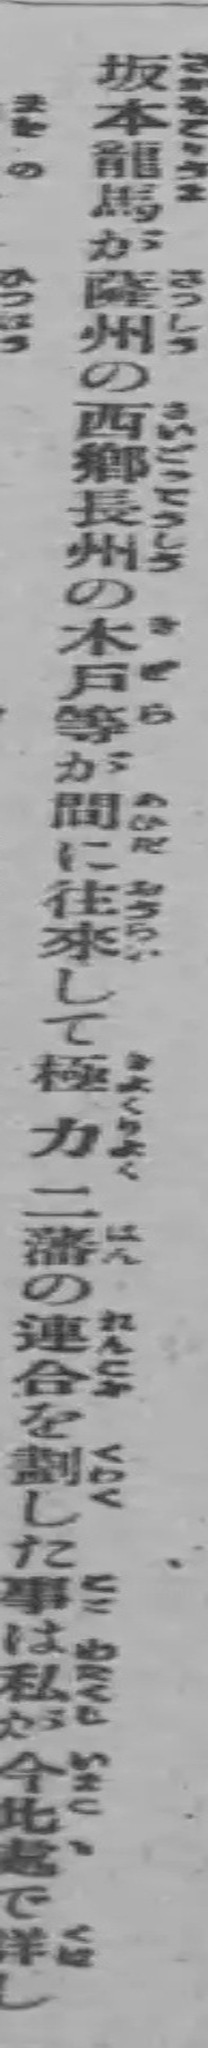坂本龍馬が薩州の西郷長州の木戸等が間に往来して極力二藩の連合を画した事は私が今此処で詳し
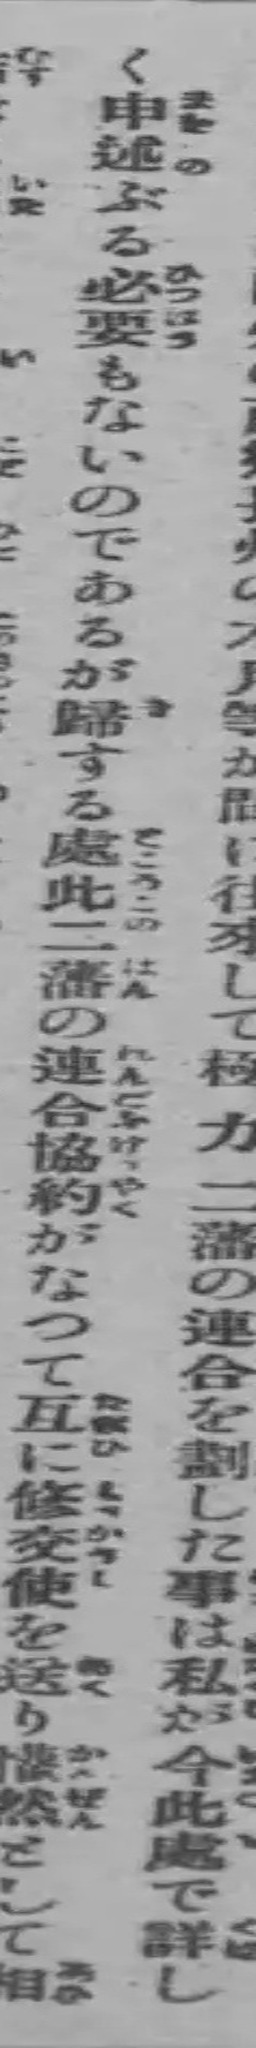く申述ぶる必要もないのであるが帰する処此二藩の連合協約がなつて互に修好使を送り懽然として相
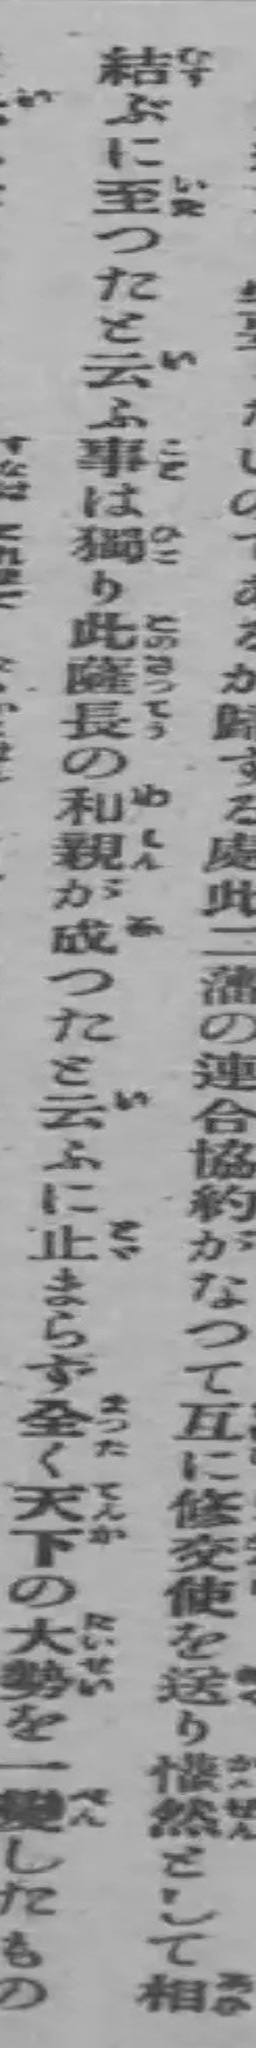結ぶに至つたと云ふ事は独り此薩長の和親が成つたと云ふに止まらず全く天下の大勢を一変したもの
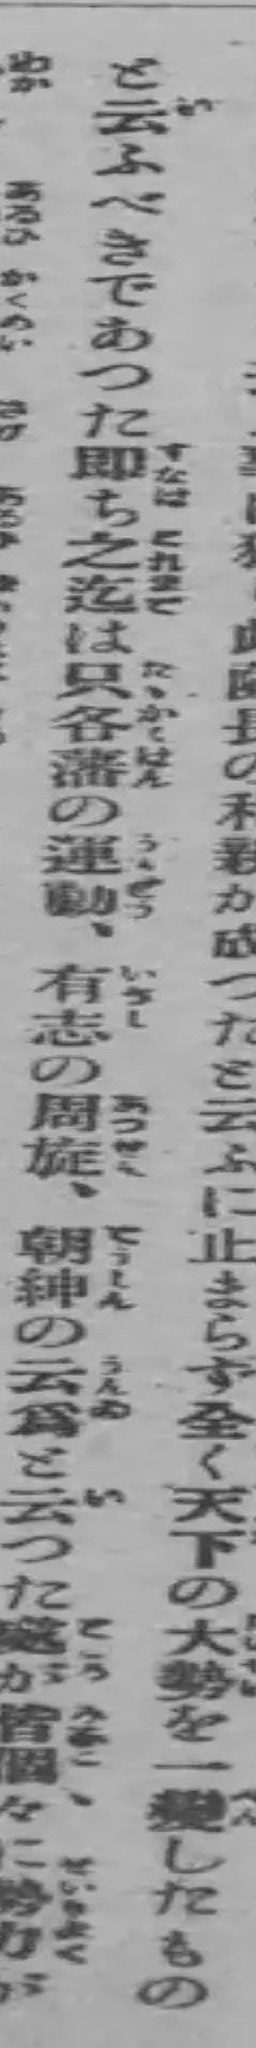と云ふべきものであつた即ち之迄は只各藩の運動、有志の周旋、朝紳の云為と云つた処が皆個々に勢力が
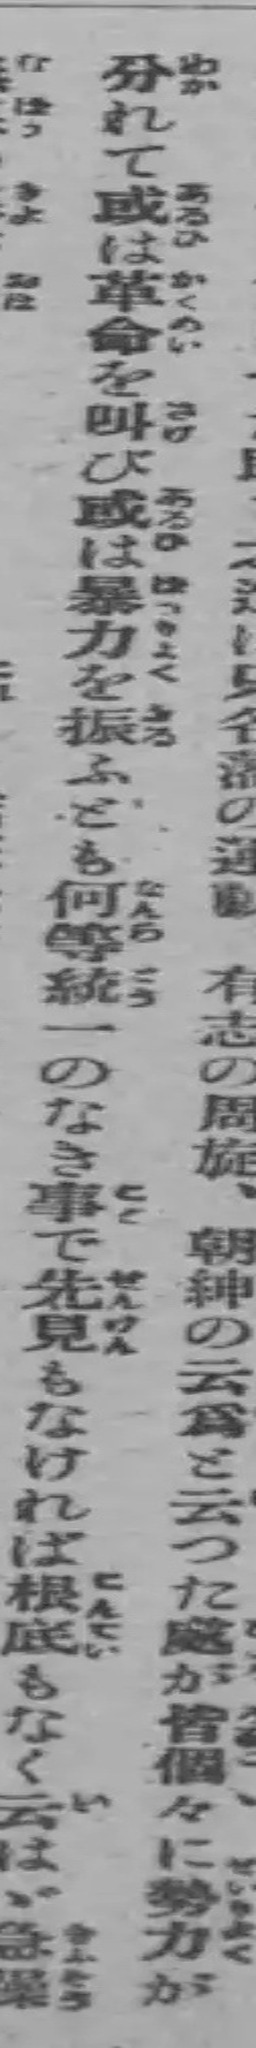分れて或は革命を叫び或は暴力を振ふとも何等統一のなき事で先見もなければ根底もなく云はゞ急躁
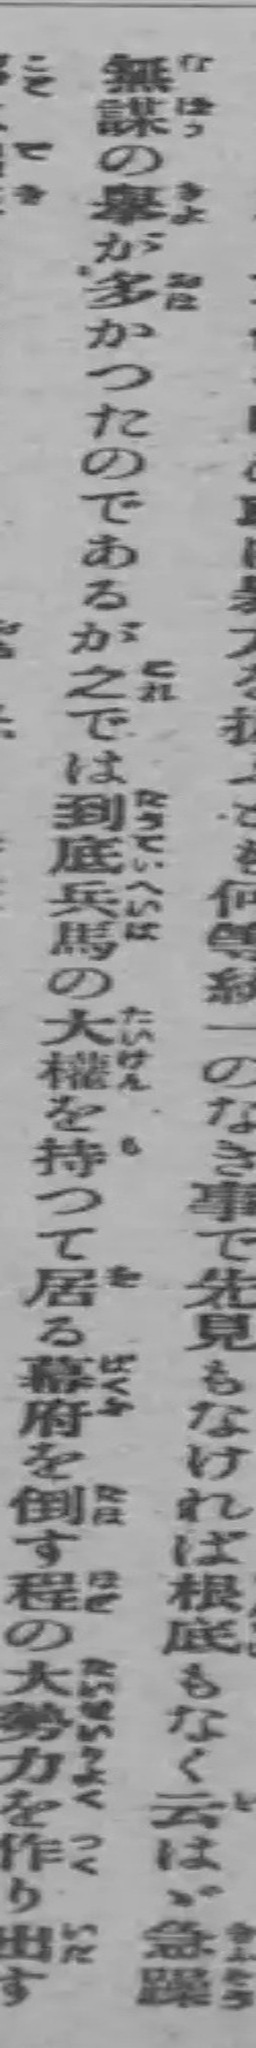無謀の挙が多かつたのであるが之では到底兵馬の大権を持つて居る幕府を倒す程の大勢力を作り出す
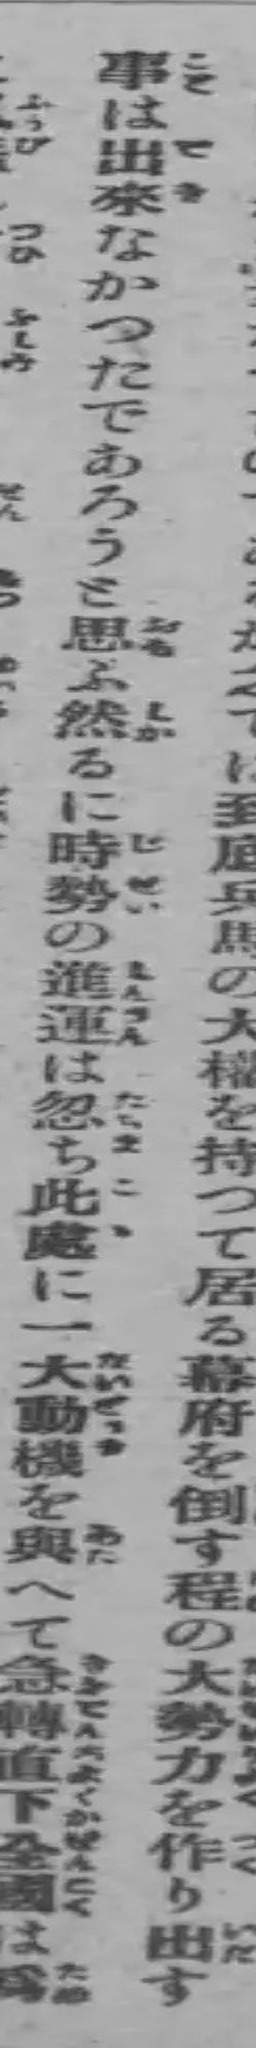事は出来なかつたであろうと思ふ然るに時勢の進運は忽ち此処に一大動機を与へて急転直下全国は為
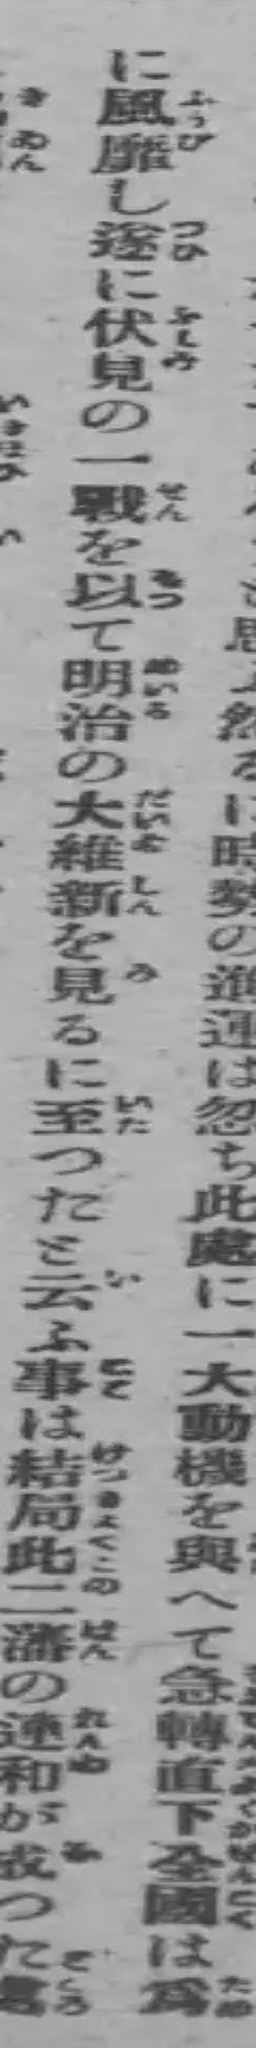に風靡し遂に伏見の一戦を以て明治の大維新を見るに至つたと云ふ事は結局此二藩の連和が成つた処
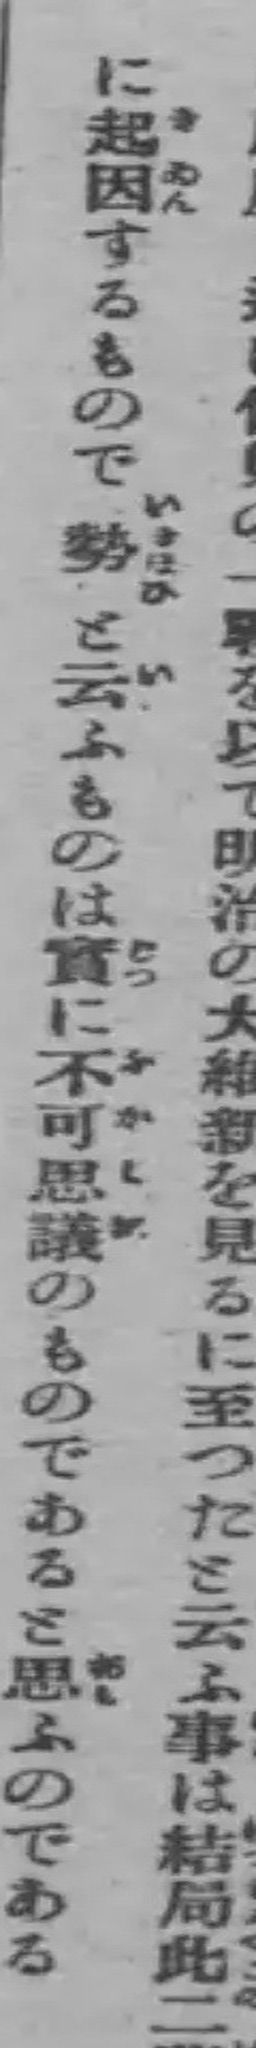に起因するもので勢と云ふものは実に不可思議のものであると思ふのである
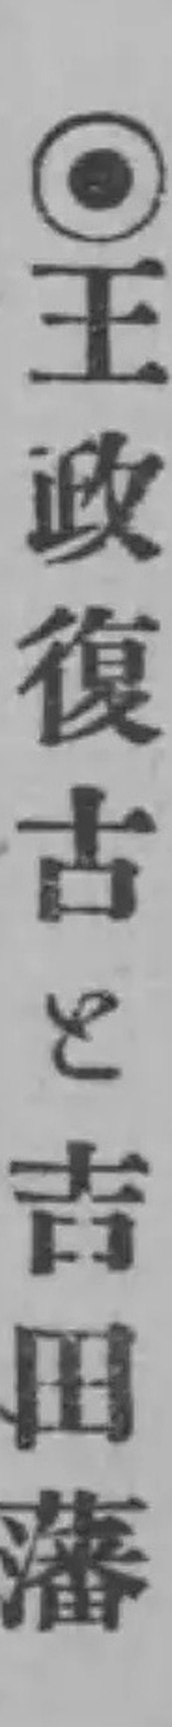⦿王政復古と吉田藩
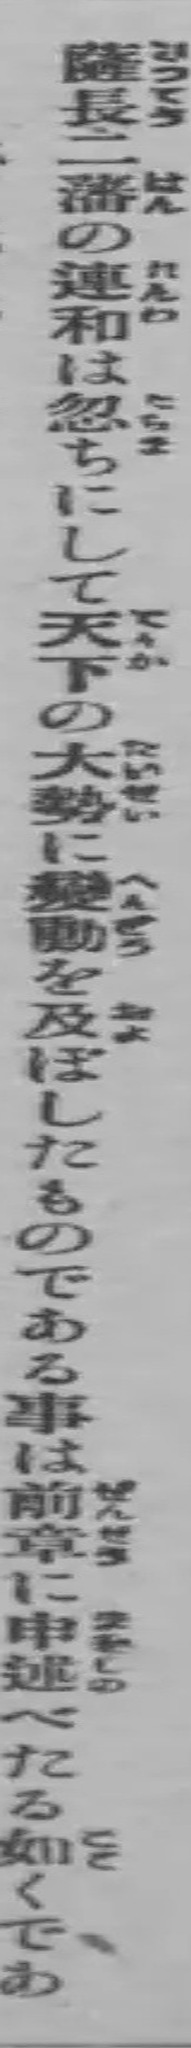薩長二藩の連和は忽ちにして天下の大勢に変動を及ぼしたものである事は前章に申述べたる如くであ
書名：豊橋市史談
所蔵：国立国会図書館 National Diet Library, JAPAN
